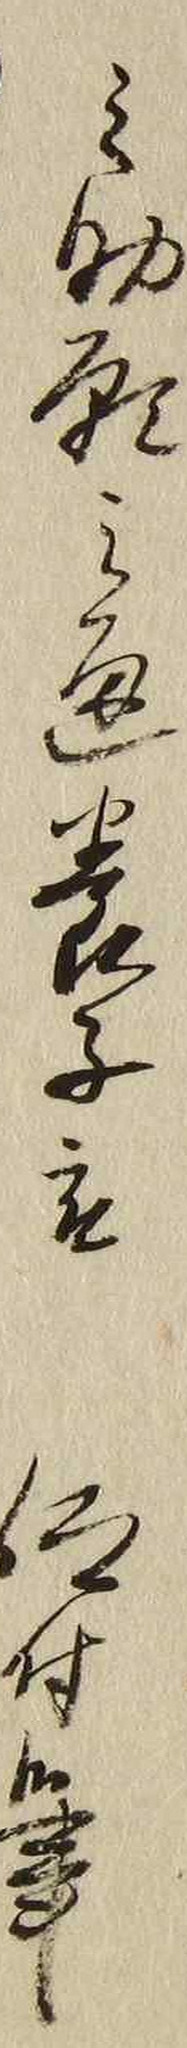之助願之通養子被仰付候事
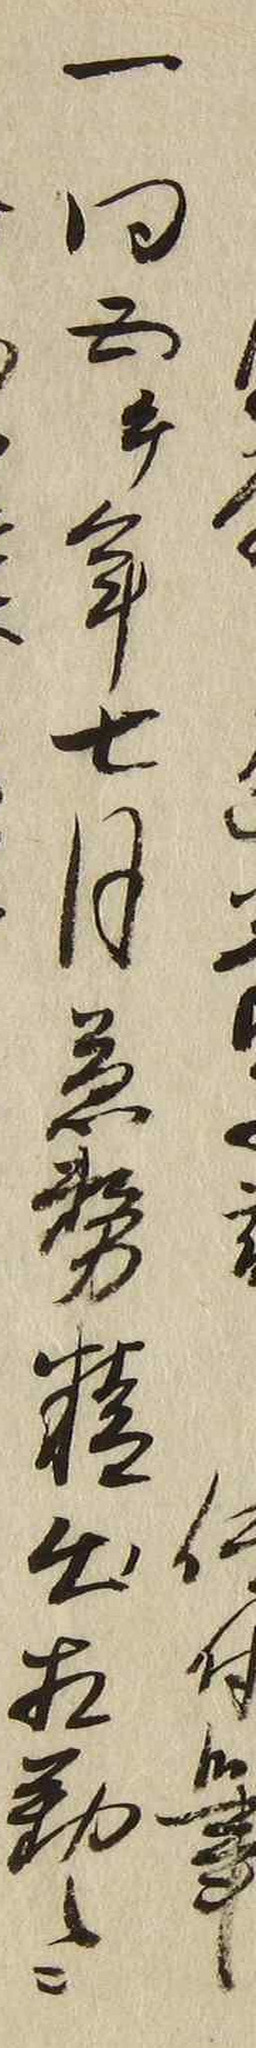一同五午年七月兼務精出相勤候ニ
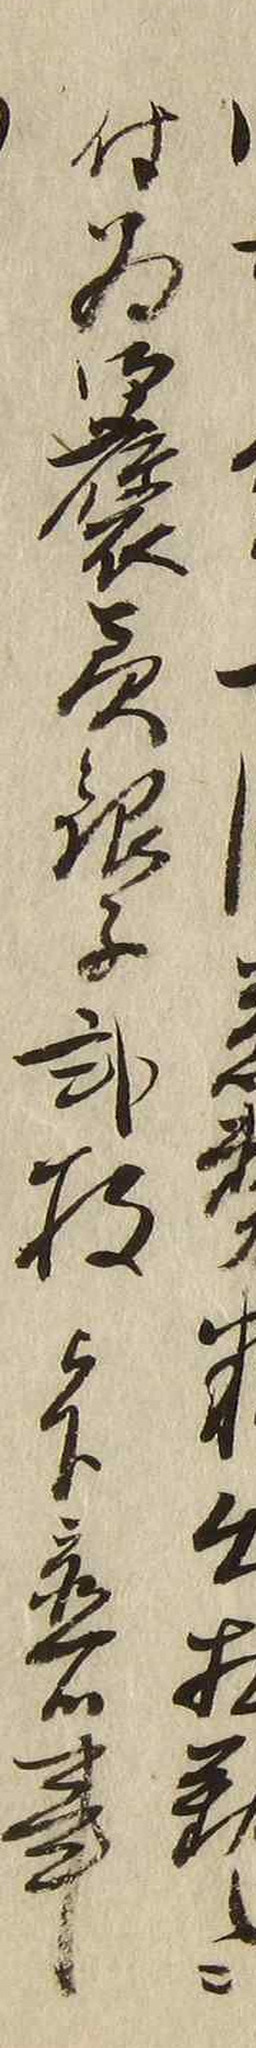付為御褒美銀子弐枚被下置候事
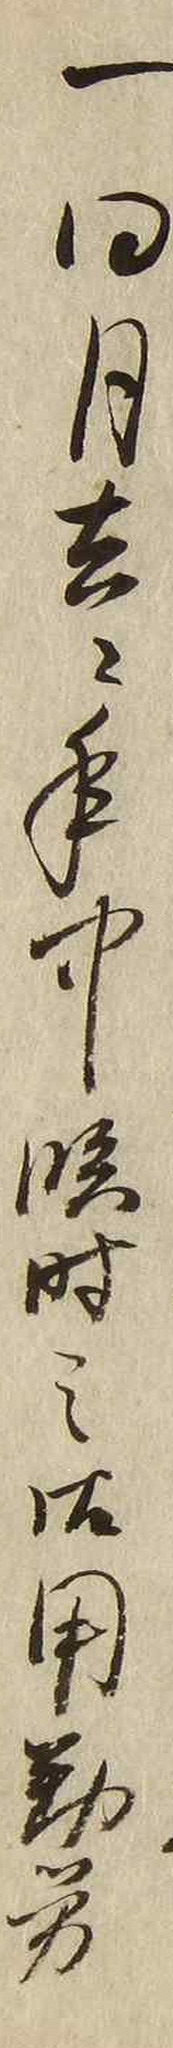一同月去々年中臨時之御用勤労

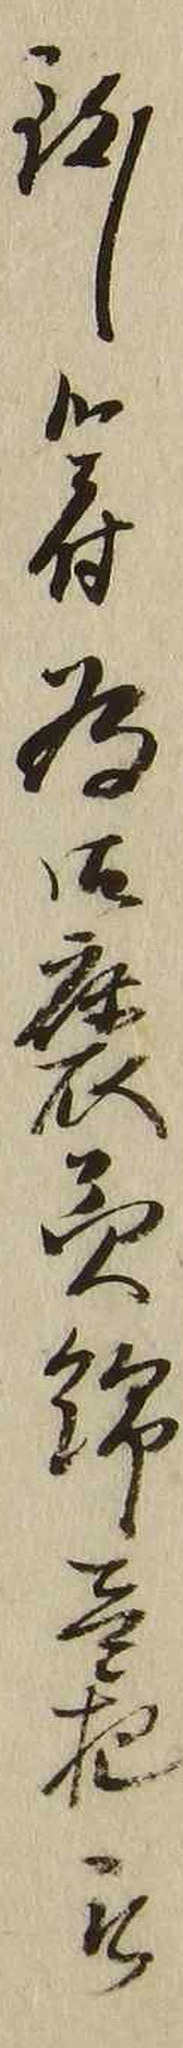致し候ニ付為御褒美綿壱把被
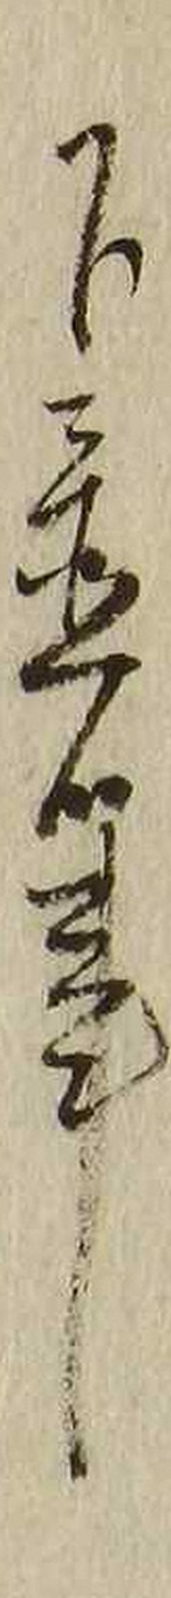下置候事
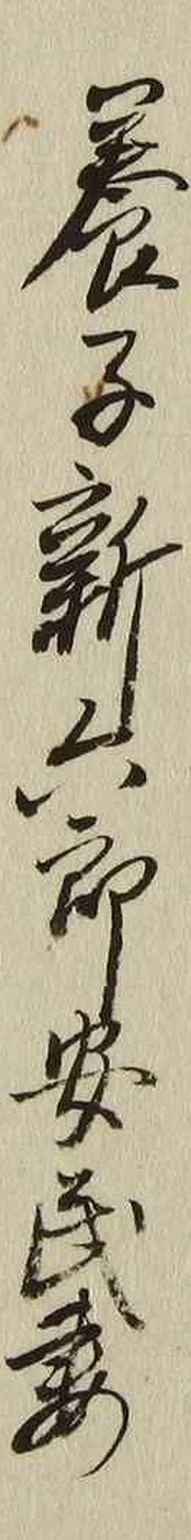養子新六郎安民妻
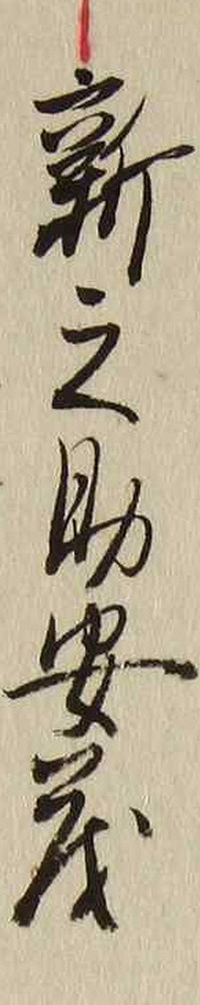新之助安茂
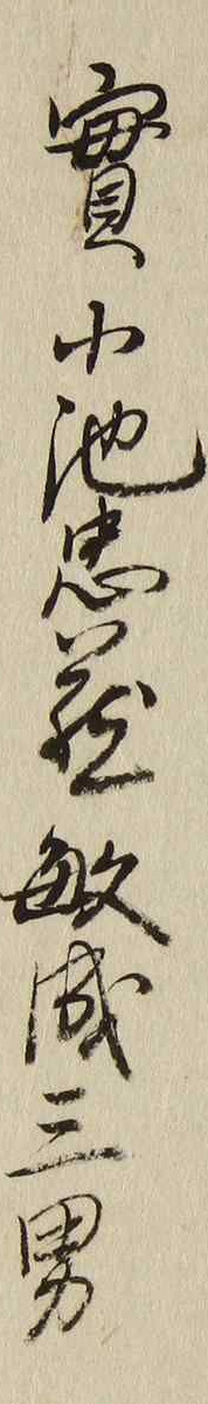実小池忠蔵敏成三男
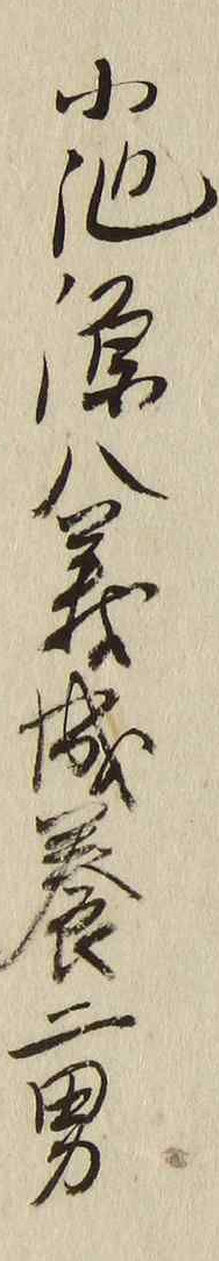小池源八義成養二男

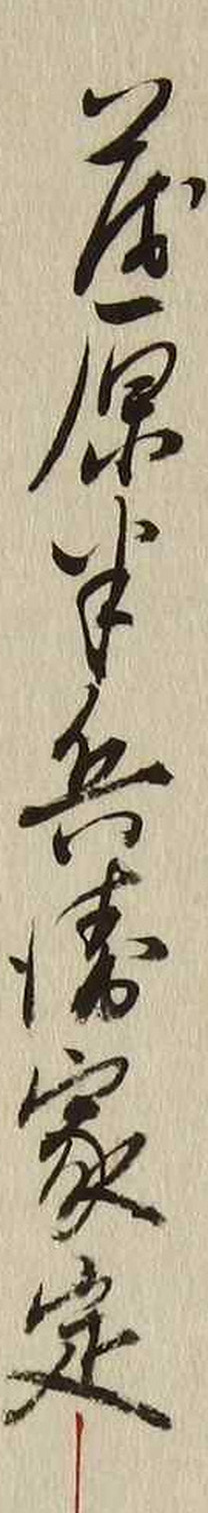茂原半兵衛家定
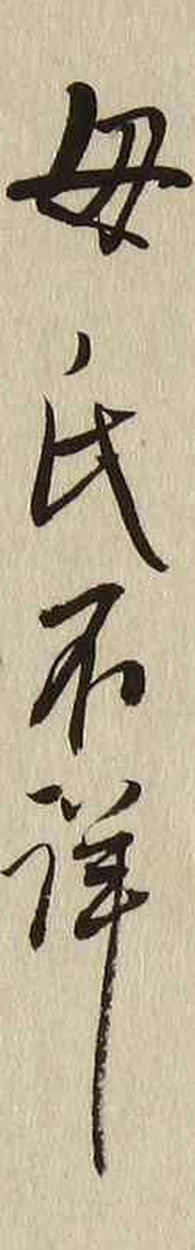母氏不詳
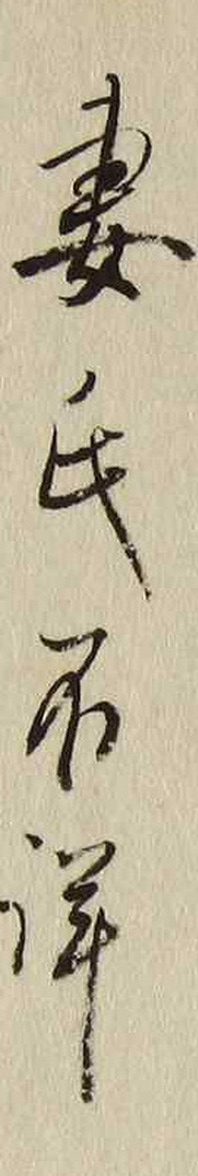妻氏不詳
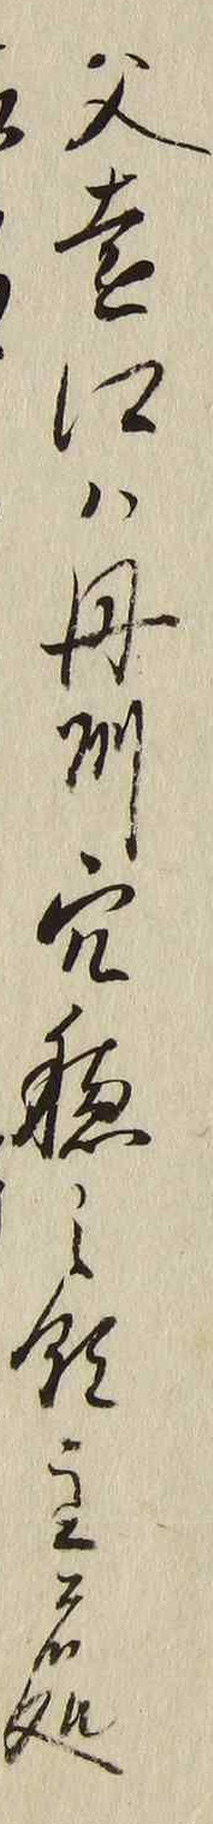父遠江ハ丹州穴穂之領主ニ候処

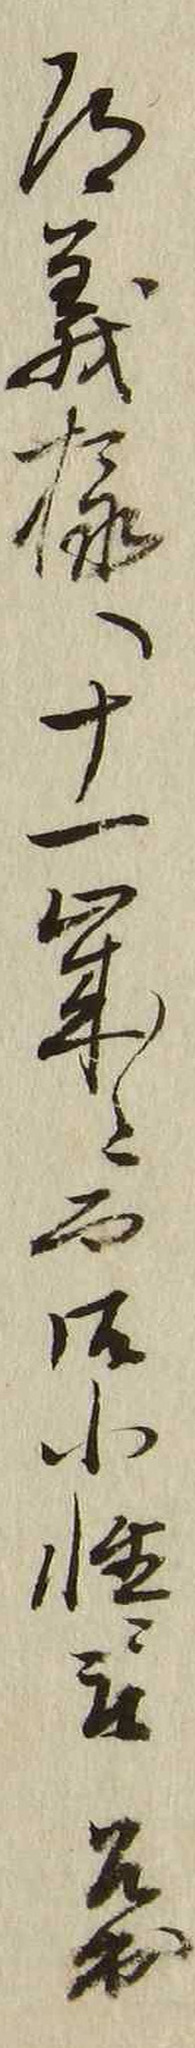道義様へ十一歳ニ而御小性ニ被召出
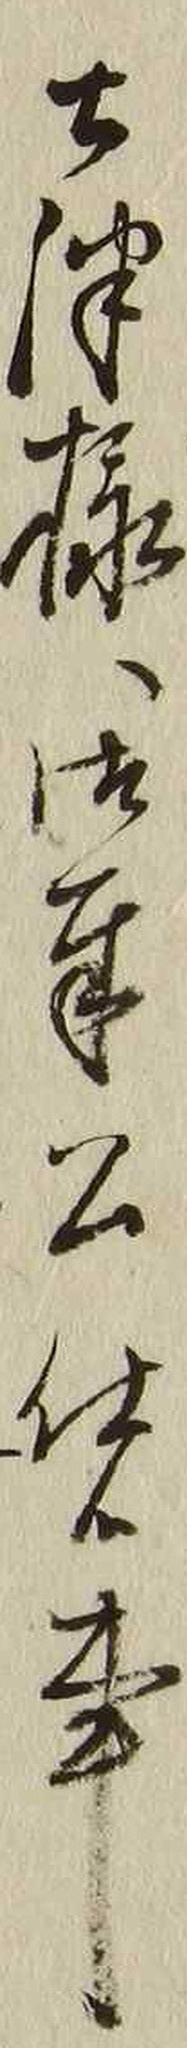土津様へ御奉公仕候事
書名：諸士系譜　巻之348　も之部4
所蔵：会津若松市立会津図書館
